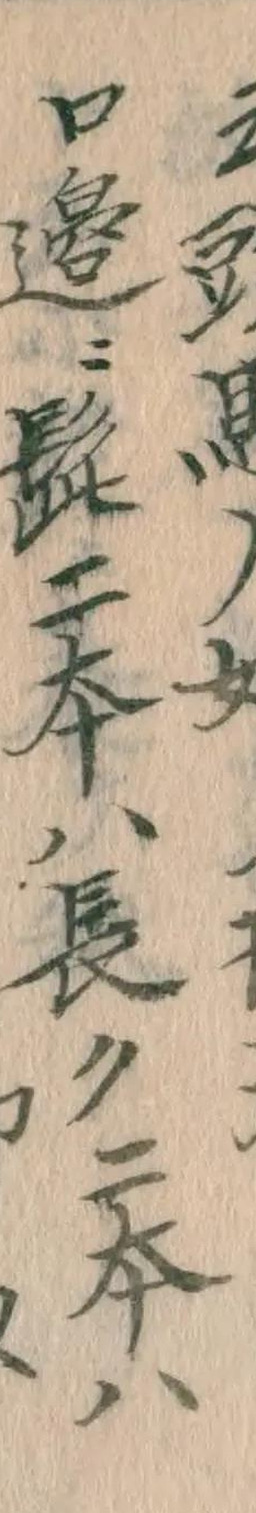口辺ニ髭二本ハ長ク二本ハ
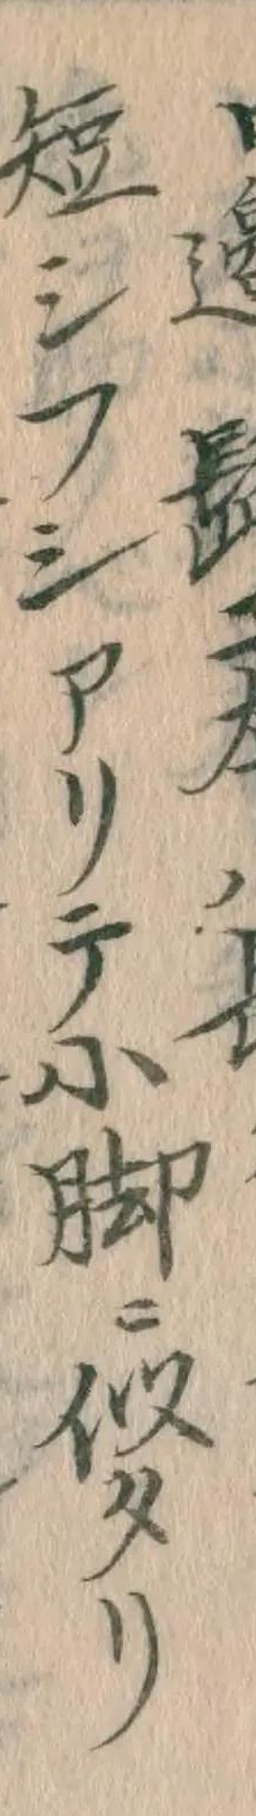短シフシアリテ小脚ニ似タリ
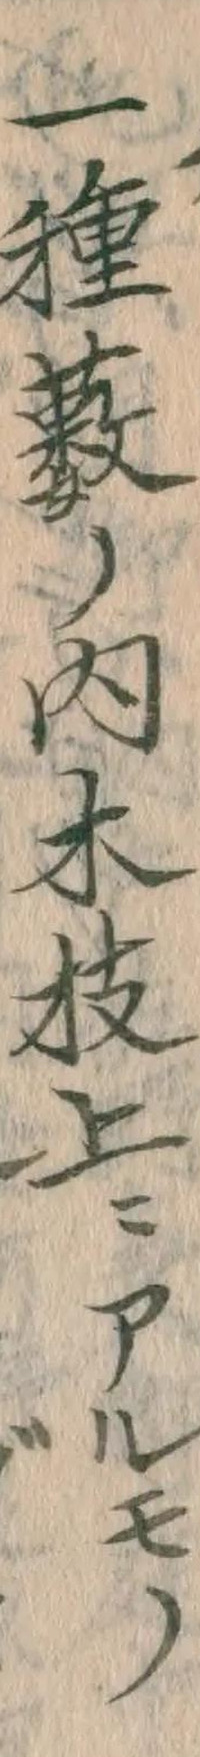一種藪ノ内木枝上ニアルモノ
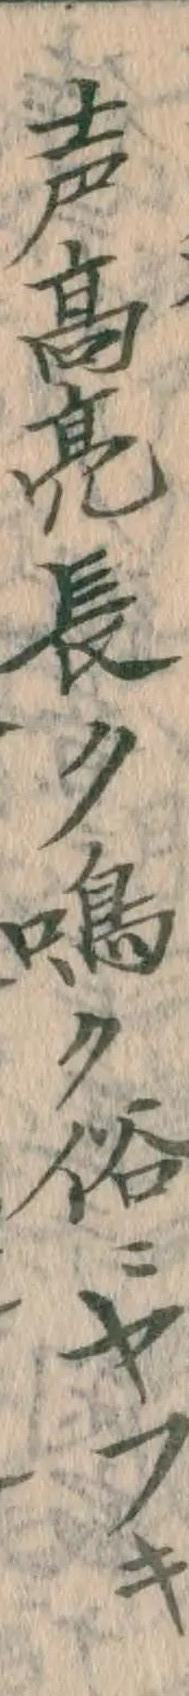声高亮長ク鳴ク俗ニヤブキ
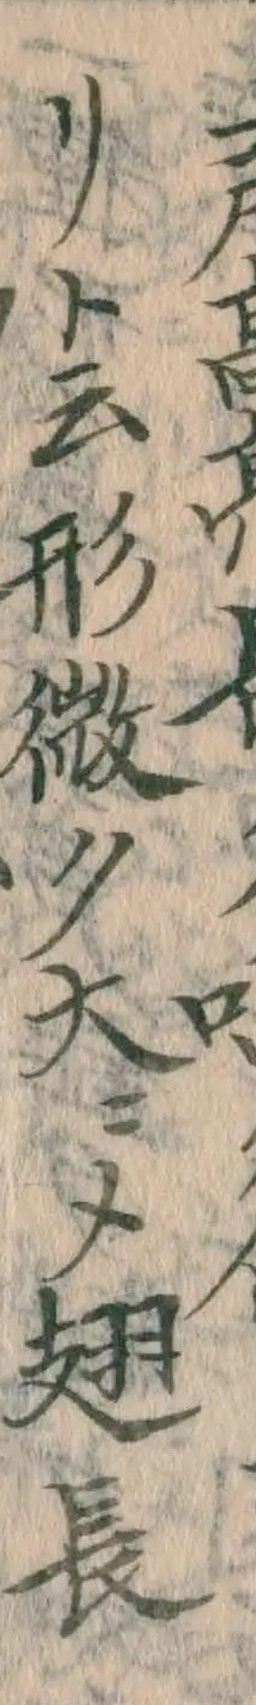リト云形微ク大ニシテ翅長
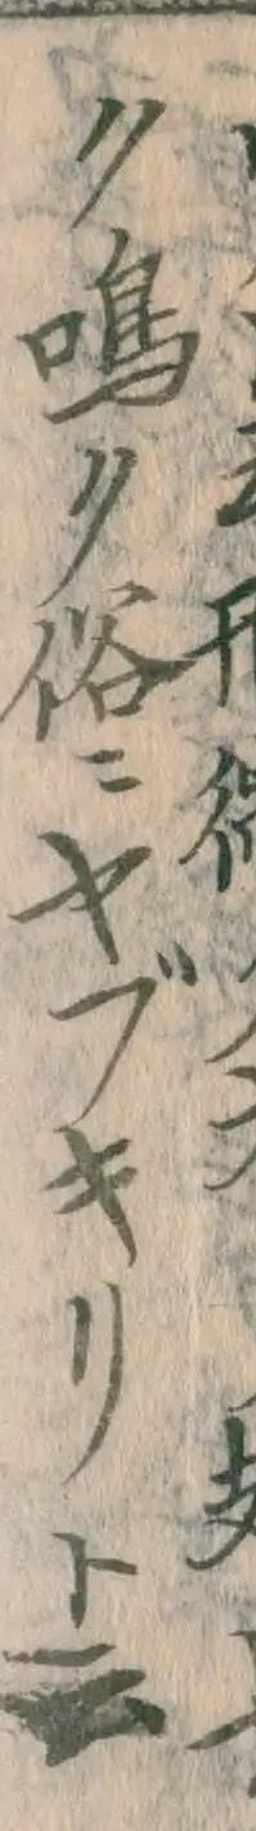ク鳴ク俗ニヤブキリト云
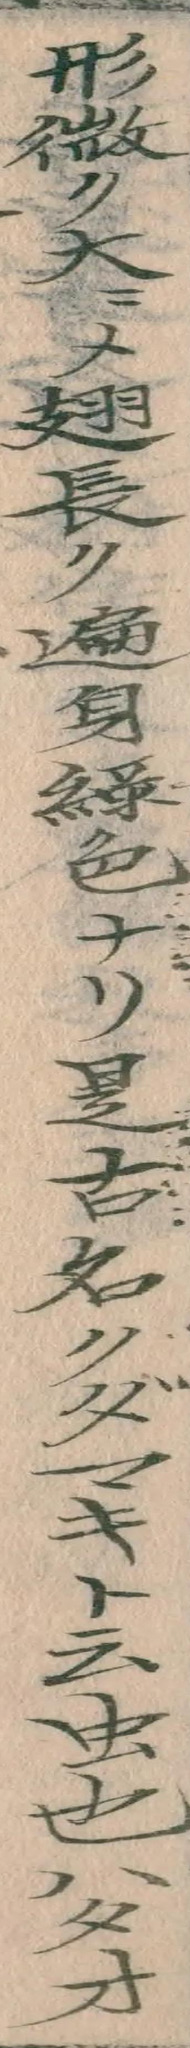形微ク大ニシテ翅長ク遍身緑色ナリ是古名クダマキト云虫也ハタオ
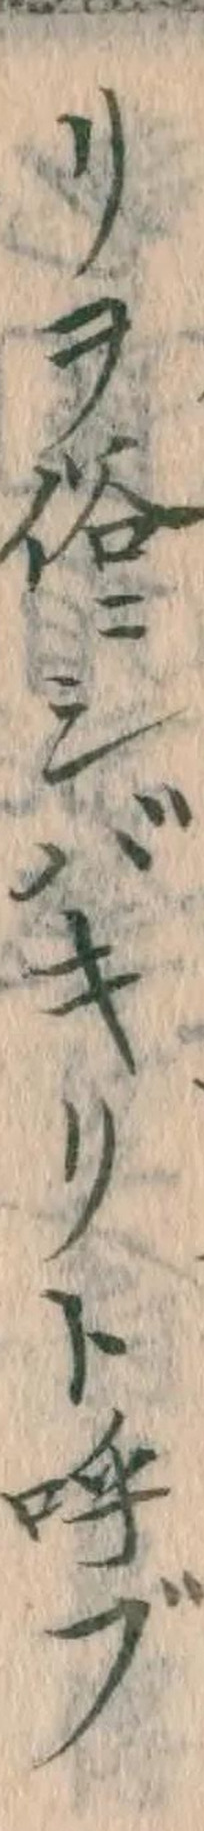リヲ俗ニシバキリト呼ブ
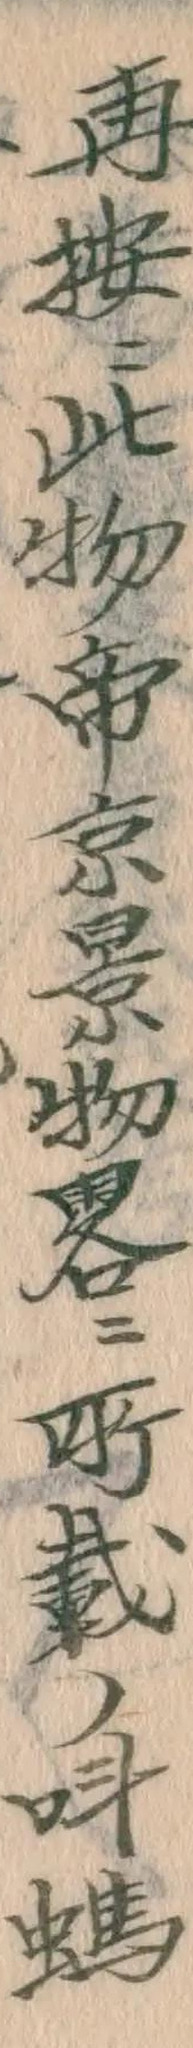再按ニ此物帝京景物略ニ所載ノ呌螞
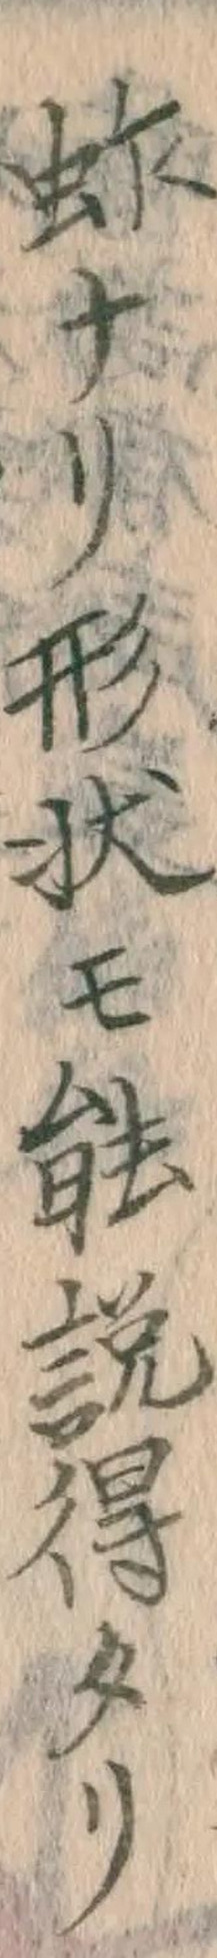蚱ナリ形状モ能説得タリ
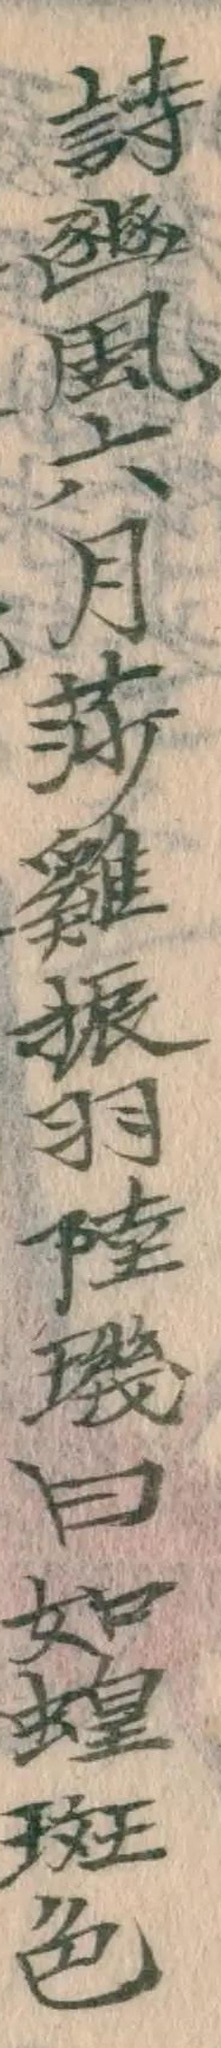詩豳風六月莎鶏振羽陸璣曰如蝗斑色
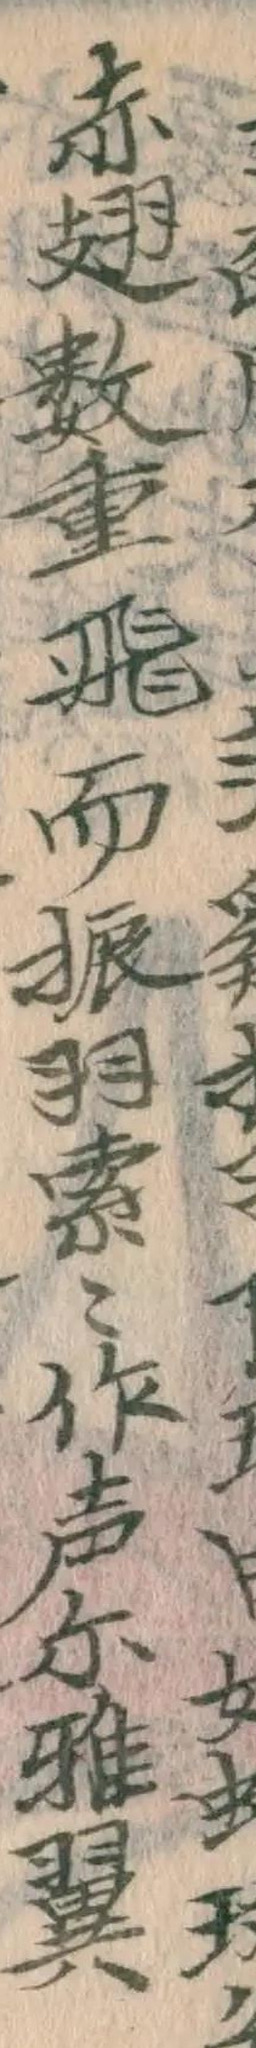赤翅数重飛而振羽索々作声尓雅翼
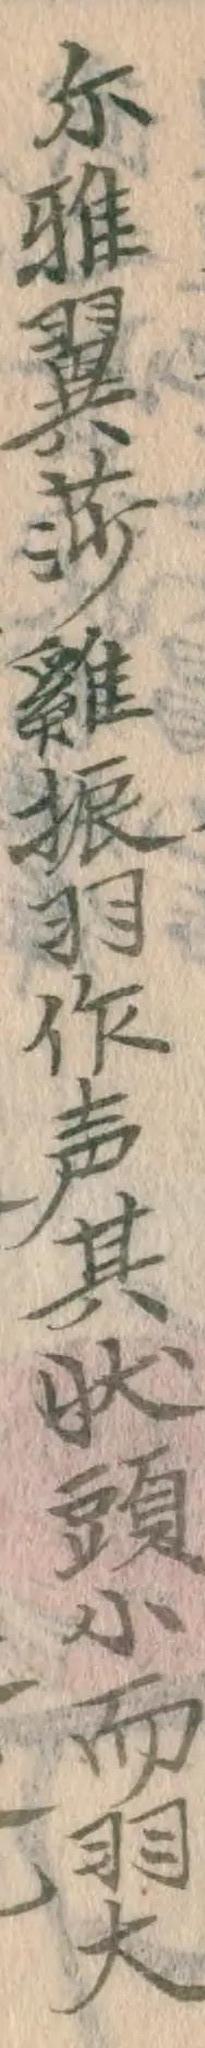尓雅翼莎鶏振羽作声其状頭小而羽大
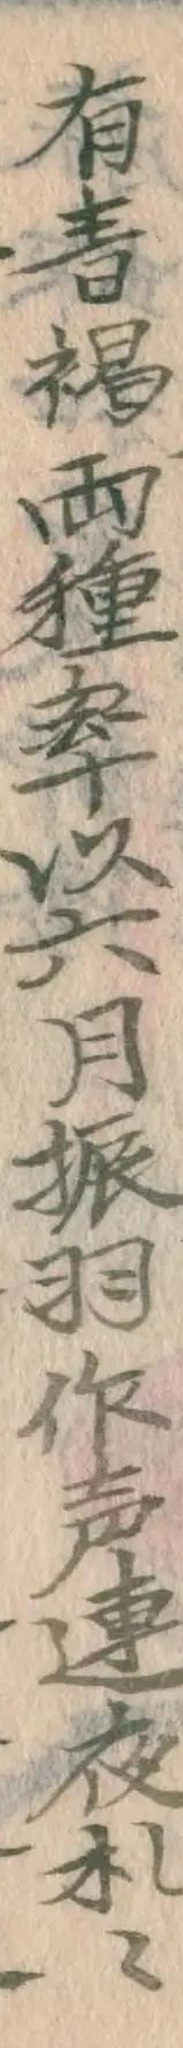有青褐両種率以六月振羽作声連夜札々
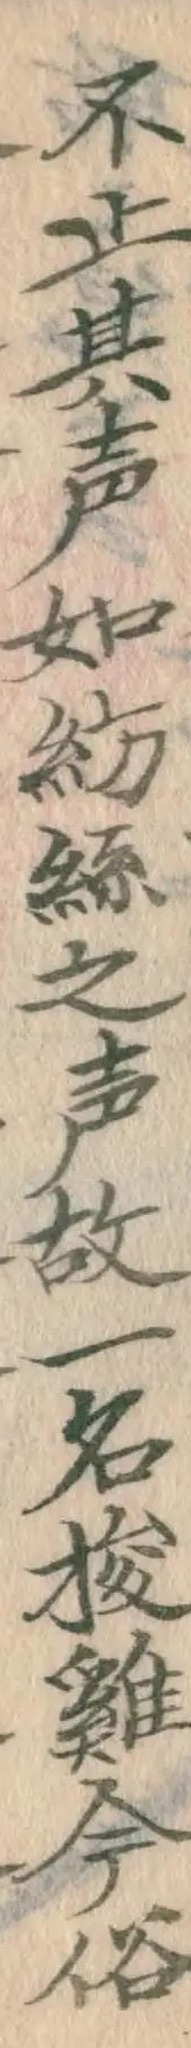不止其声如紡糸之声故一名梭鶏今俗
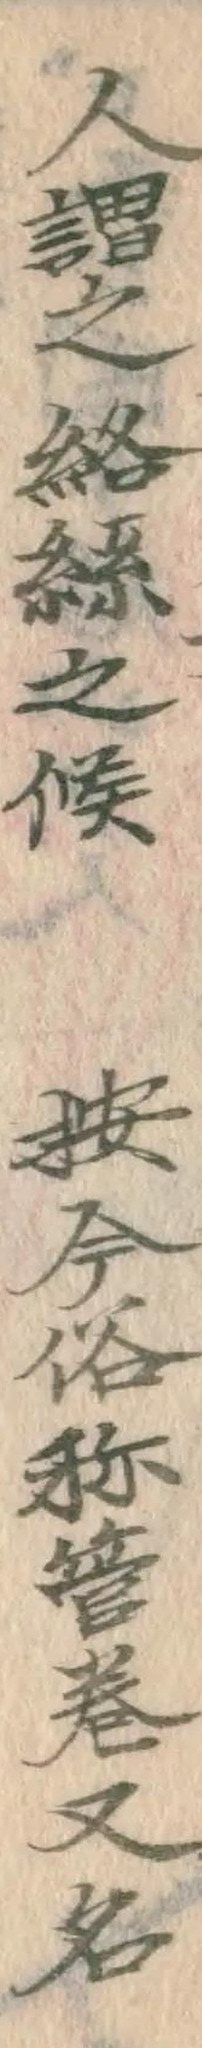人謂之絡糸之候按今俗称管巻又名
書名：千蟲譜 3巻. [3]
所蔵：国立国会図書館 National Diet Library, JAPAN
